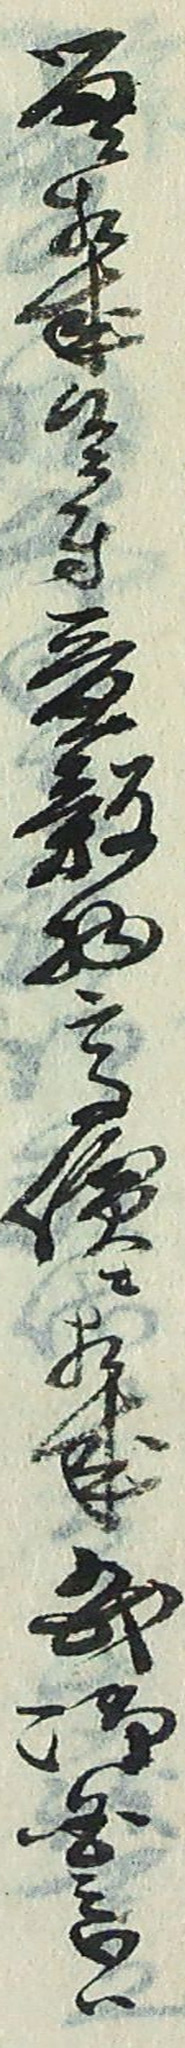留ニ相成候ニ付益穀物高價ニ相成當御国之義ハ
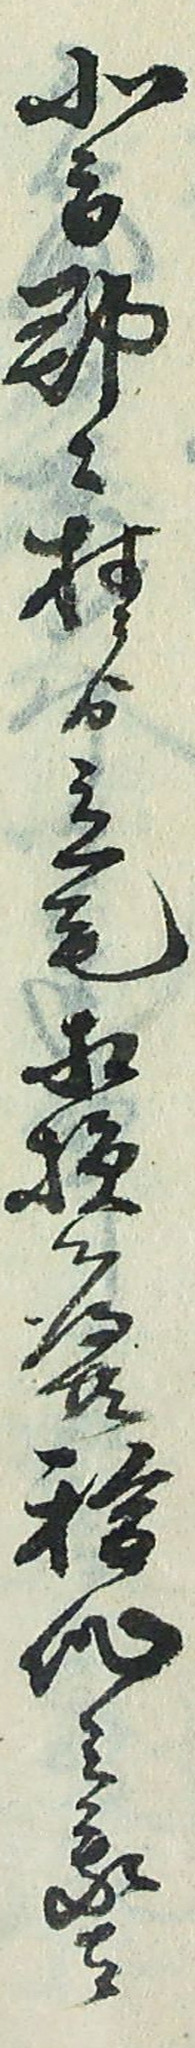北方郡之村ニゟ立毛相損候得共稲作之義者
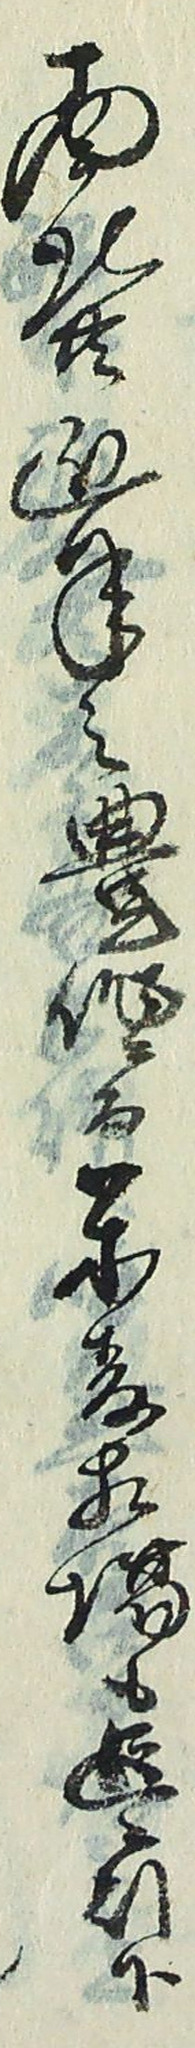南北共近年之豊作ニ而米麦相場も追々引下
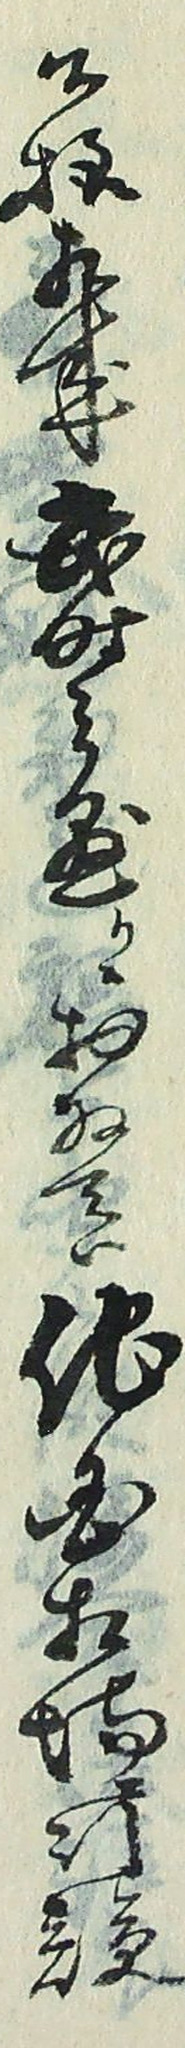候様相成當時之懸りニおゐてハ他国相場ニ引競
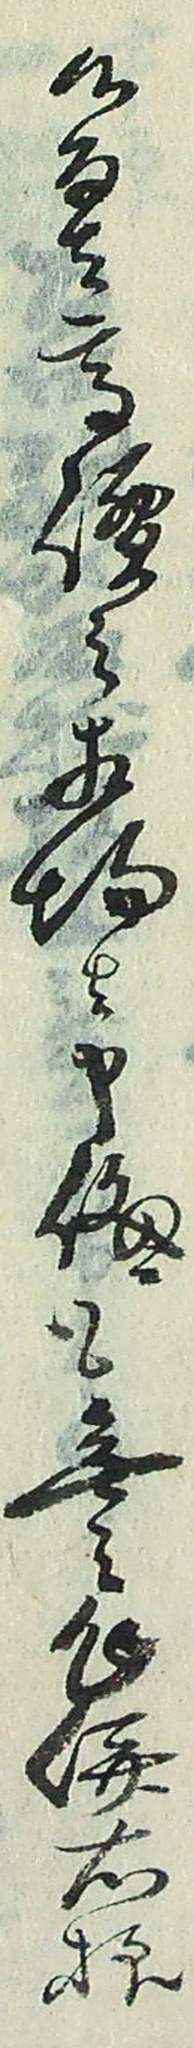候而者高價之相場者申儀ニも無之乍併右様
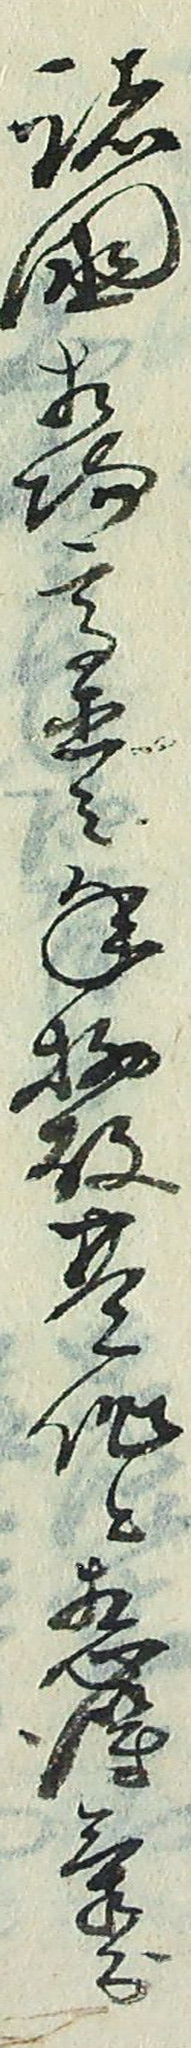諸国相場高直之年柄故豊作と相心得氣分
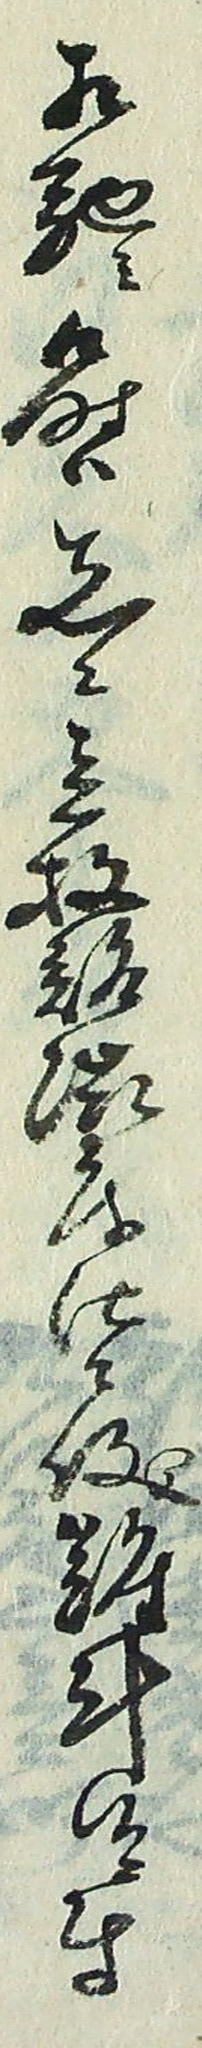相弛ミ候時ハ先々壱牧難渋茂仕候儀難斗候ニ付
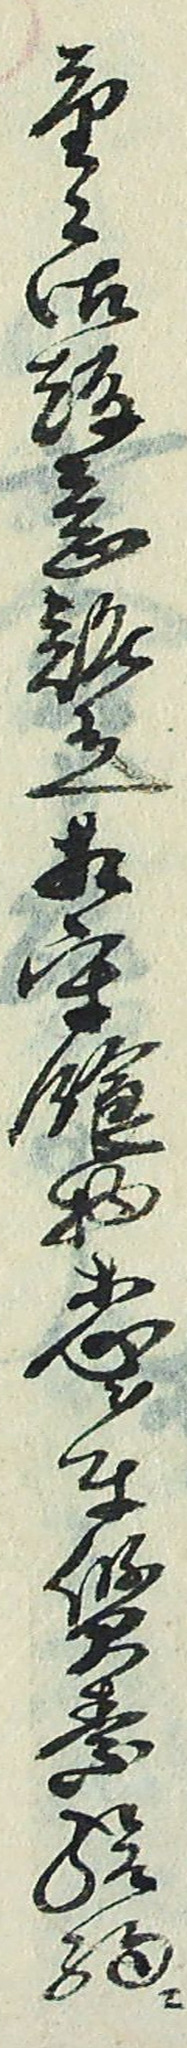重々御趣意難有相守食物相心ヲ付質素倹約ニ
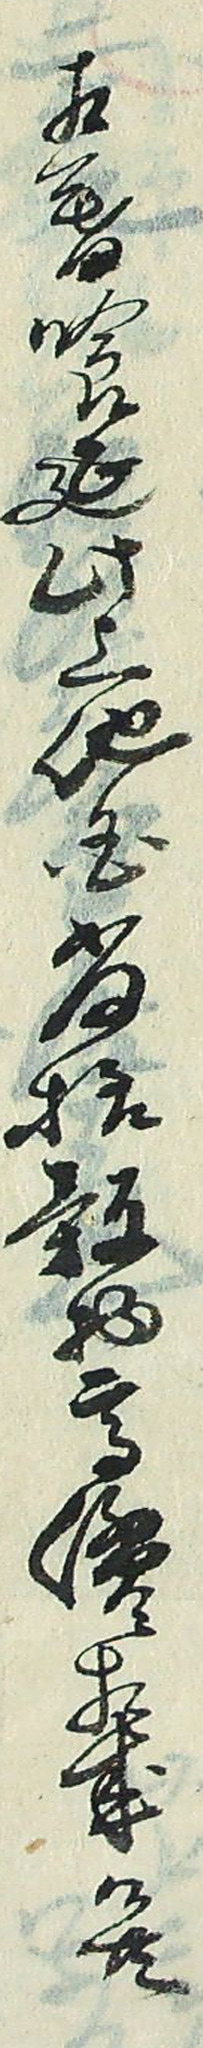相暮喰延此上他国如何様穀物高價ニ相成候共
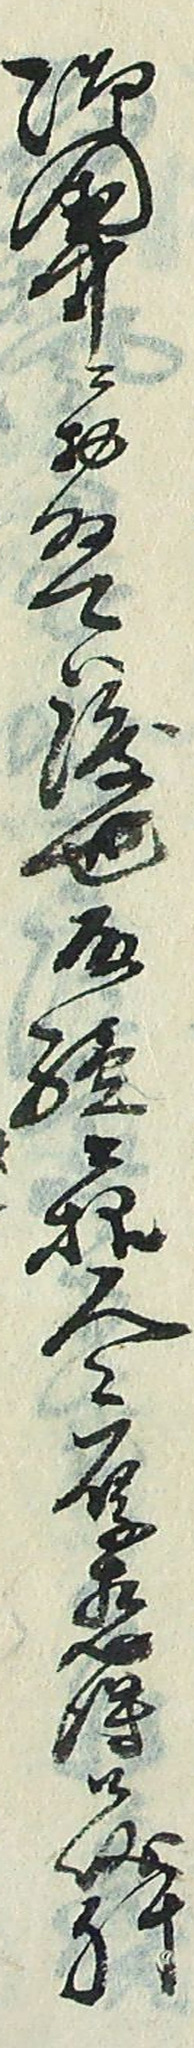御国中ニおゐてハ渡世取續候様人々厚相心得候儀肝
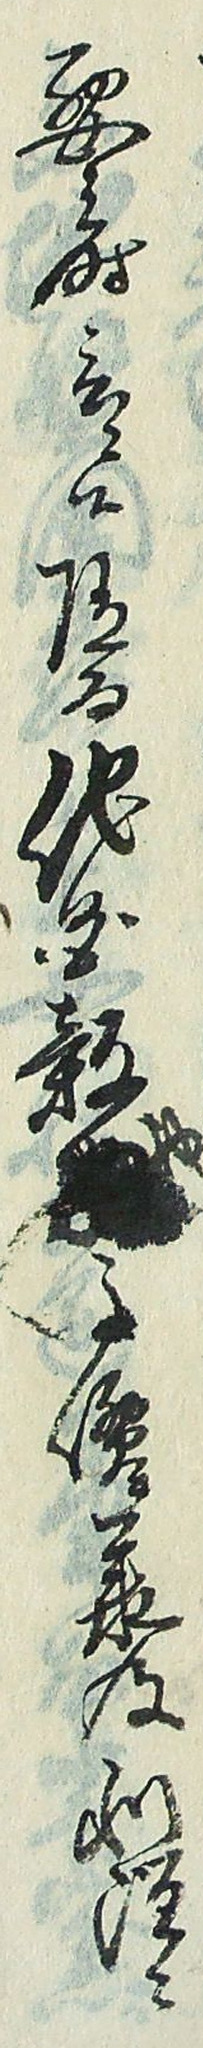要之時云々候随而他国穀物高價ニ承及利潤ニ

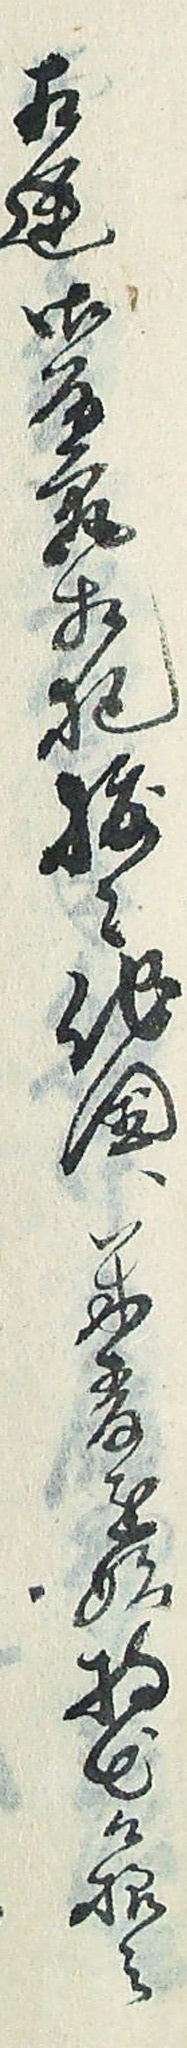相迷御取究相犯抜之他国へ米麦を始指出候様之
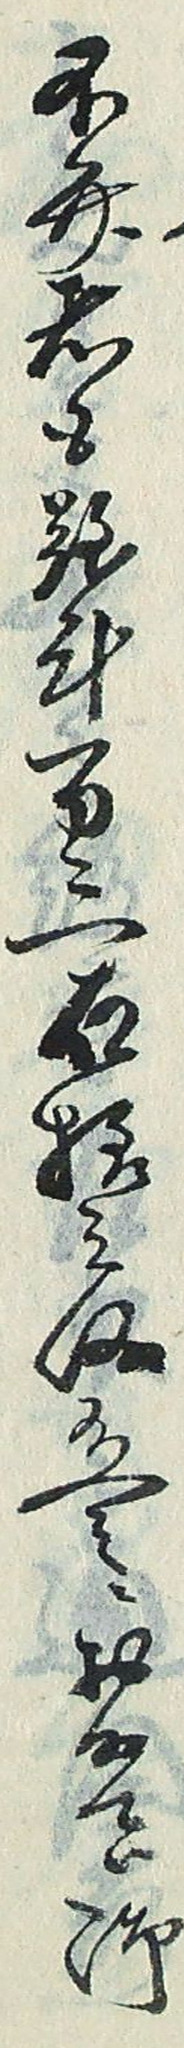不弁者も難斗万々一右様之儀有之ニおゐてハ御
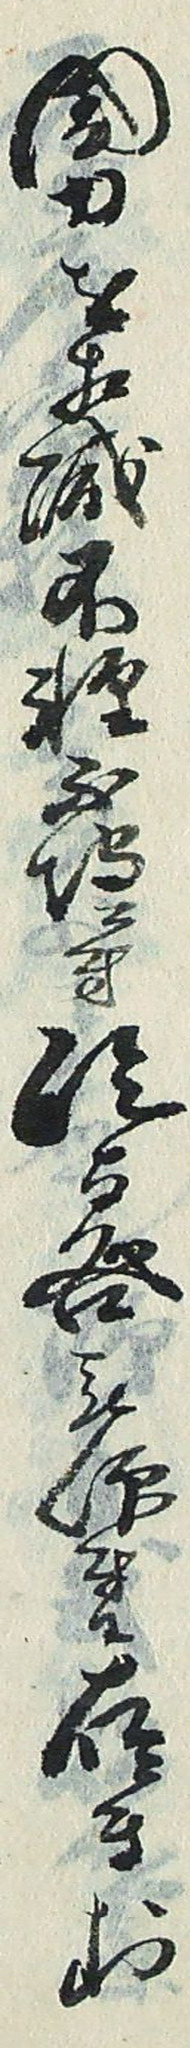国力を相減不軽不埒ニ付屹と咎被仰付候右ニ付村
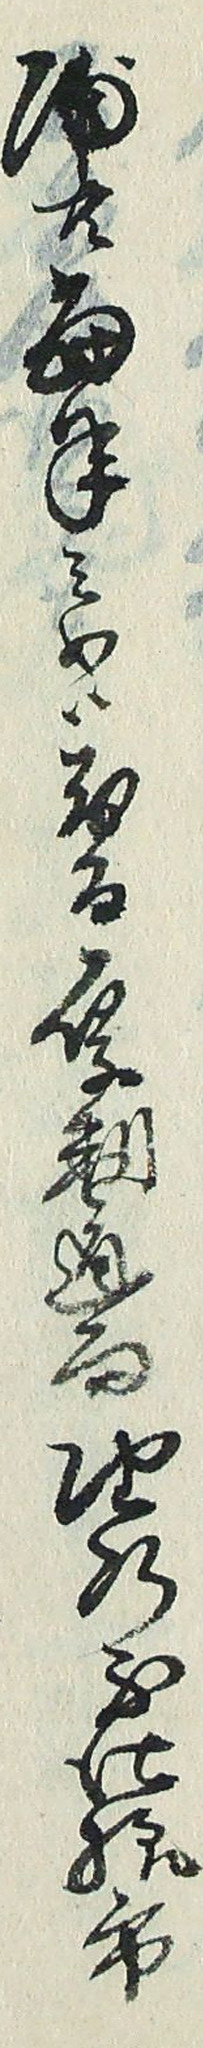浦共當年之義ハ別而厚制道向油断不仕様市
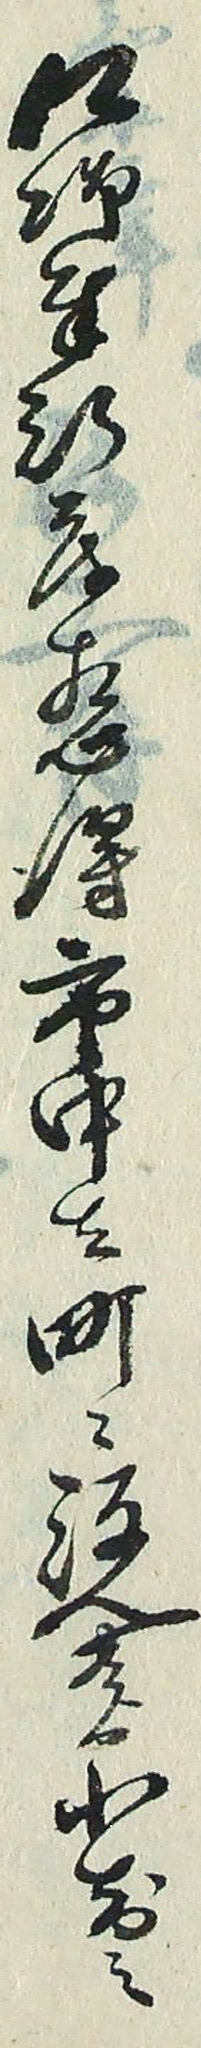郷御奉行も相心得市中者町々役人共ゟ小前之
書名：諸御趣意書并御下知向之写
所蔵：鳴門教育大学 Naruto University of Education
